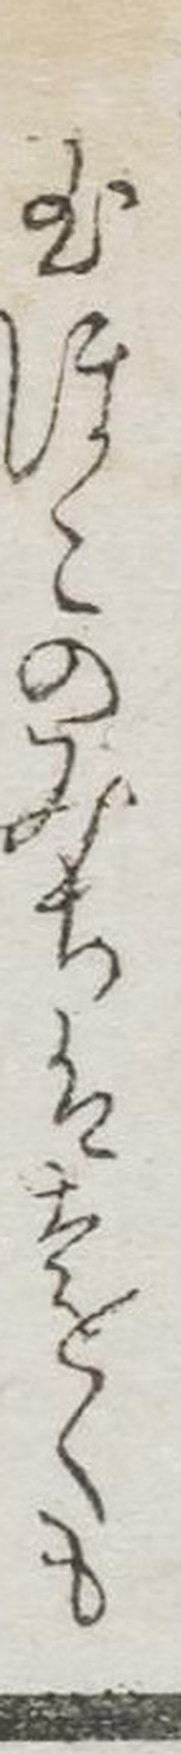玉ほこのみちは遠くも
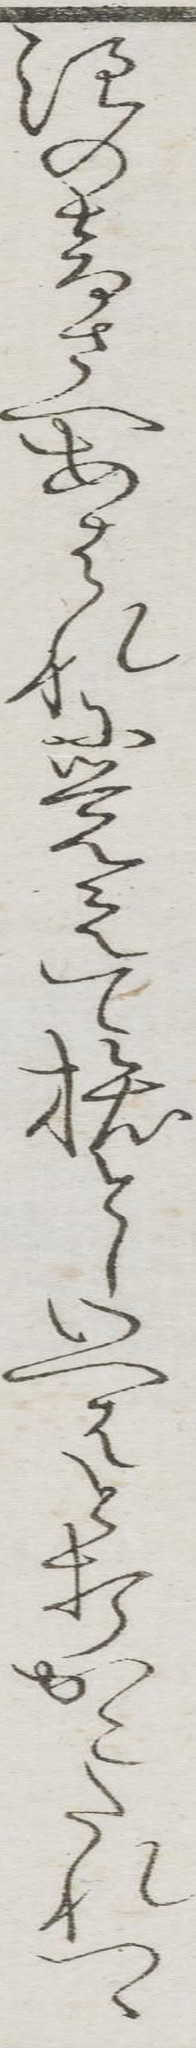浪の音さへあはれに覚えて旅としいへはと打かこたれつゝ
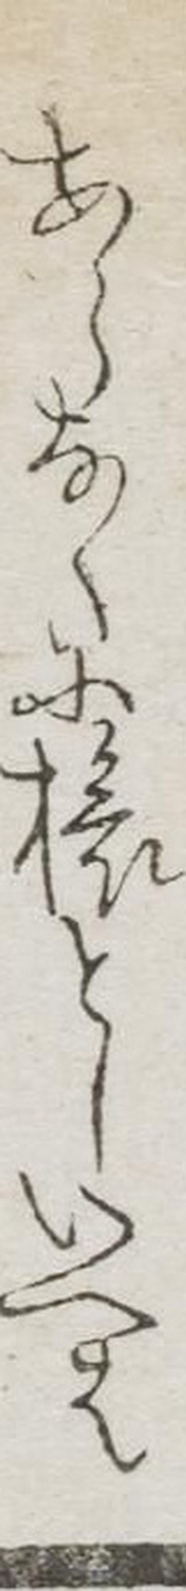あらなくに旅としいへは
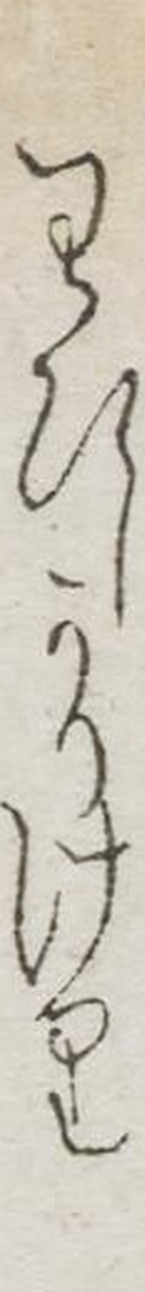わひしかりけり
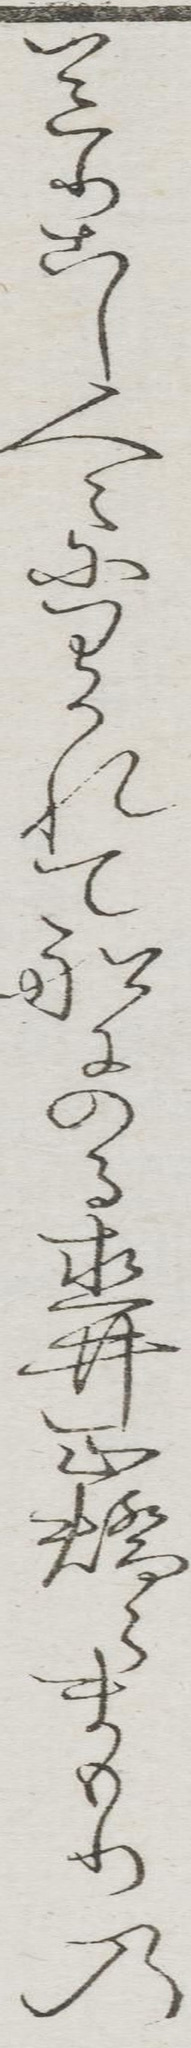送りこし人々にわかれて船にのる直井正喬らまもりの
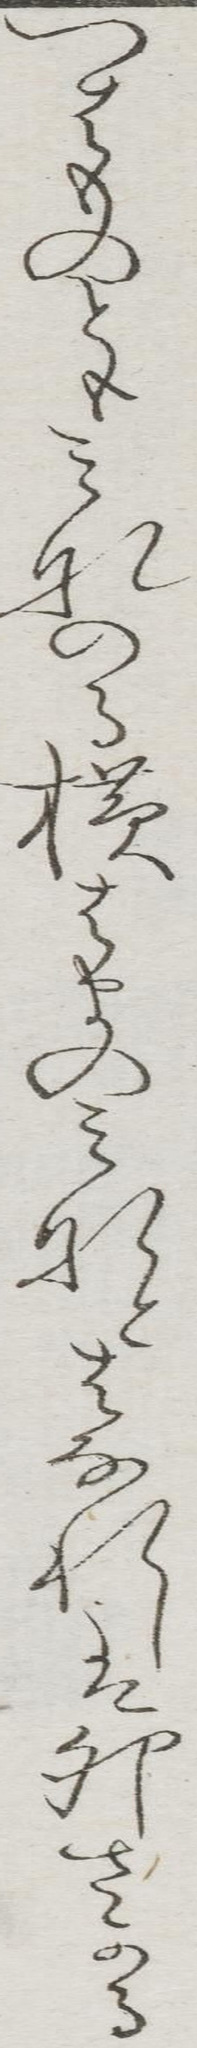つはものともみなのる横はまのみなとはなれしは卯さかる
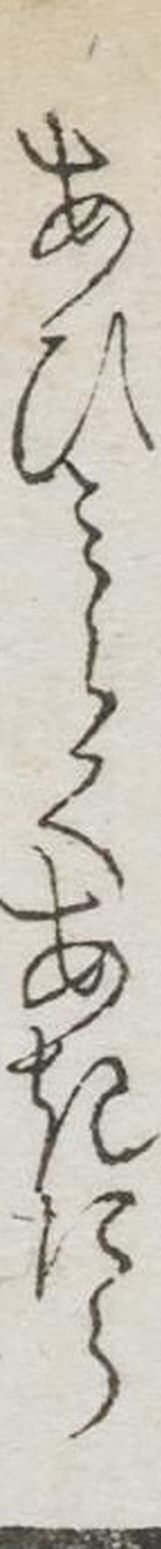あひみらくあきたら
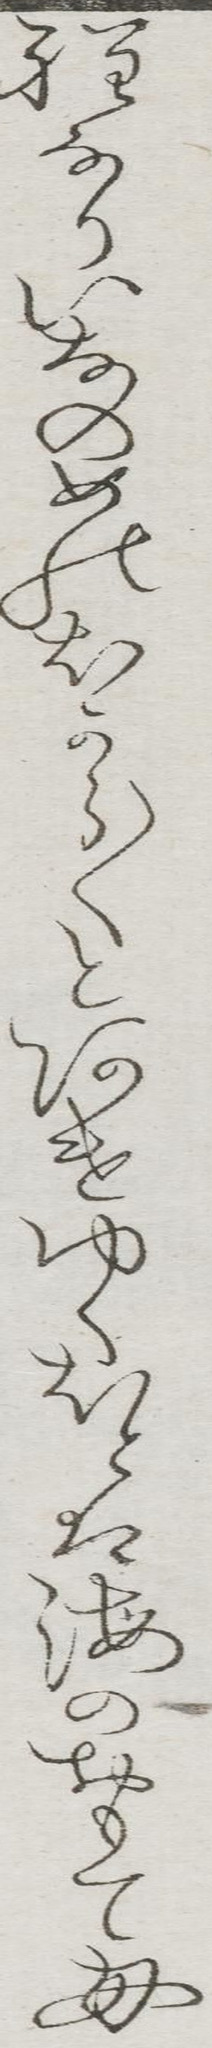程なりいなのめのほから〳〵とあけゆくほとは海のおもても
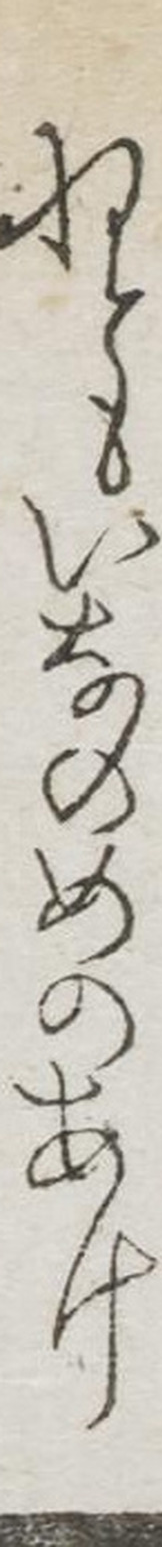ねともいなのめのあけ
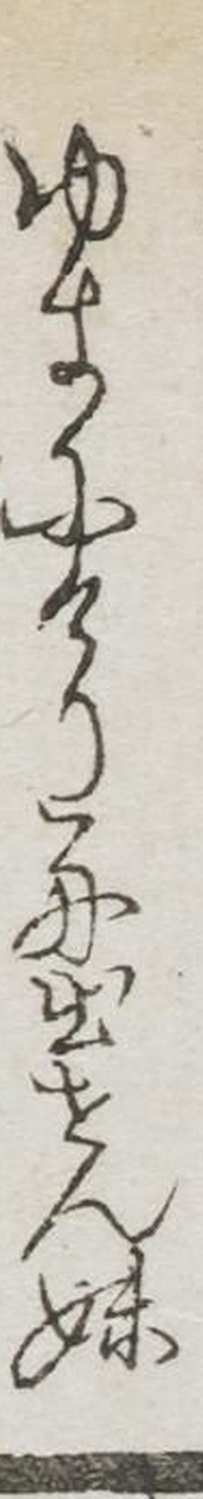ゆきにけり舟出せん妹
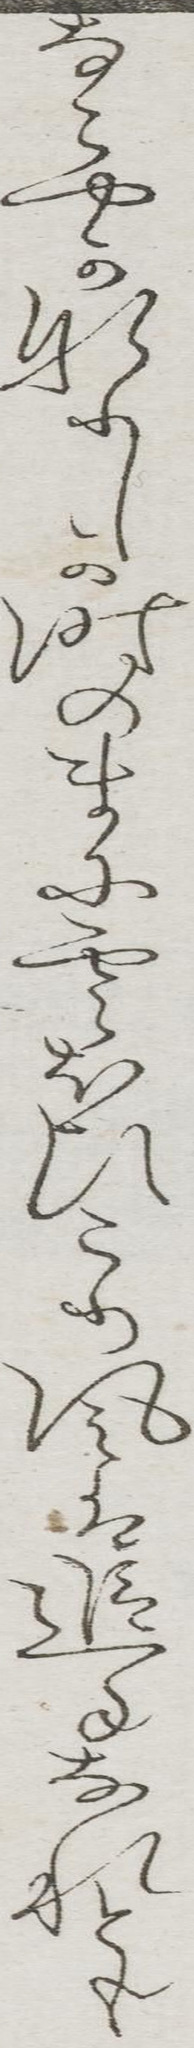なこやかなりしか時のまに雲おひこり風は追てなれとも
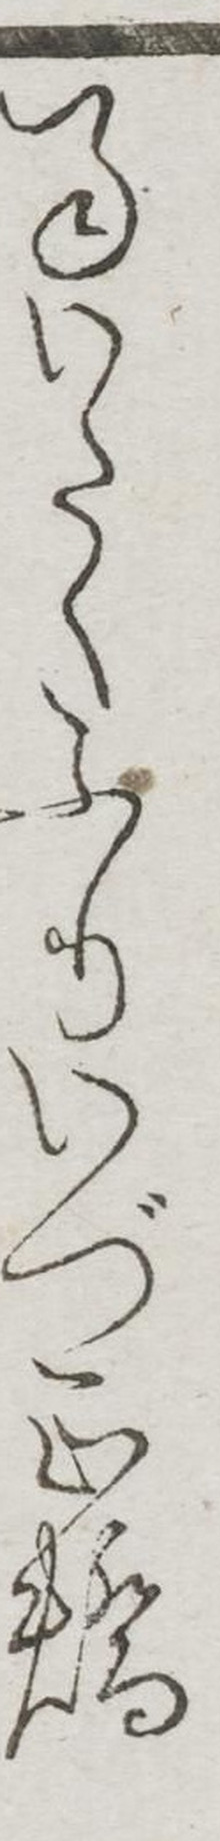雨いたくふりいづ正矯
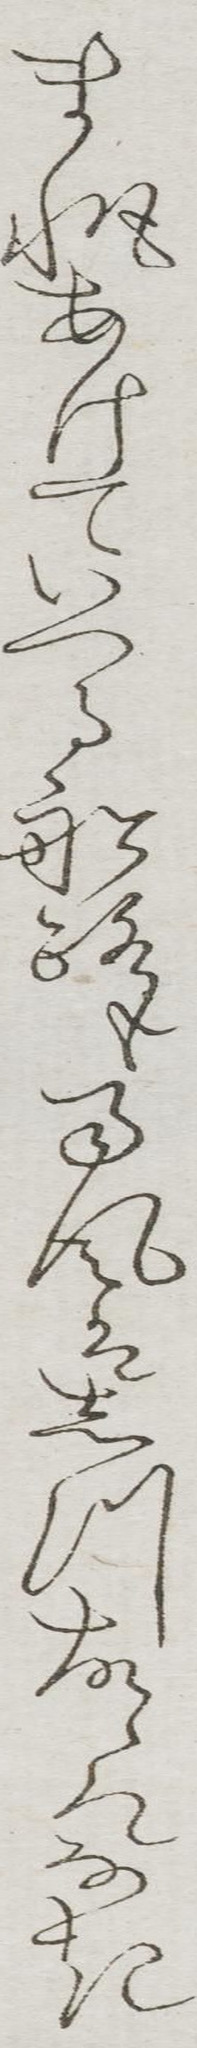ま帆あけていつる船路も雨風はしつこゝろなき
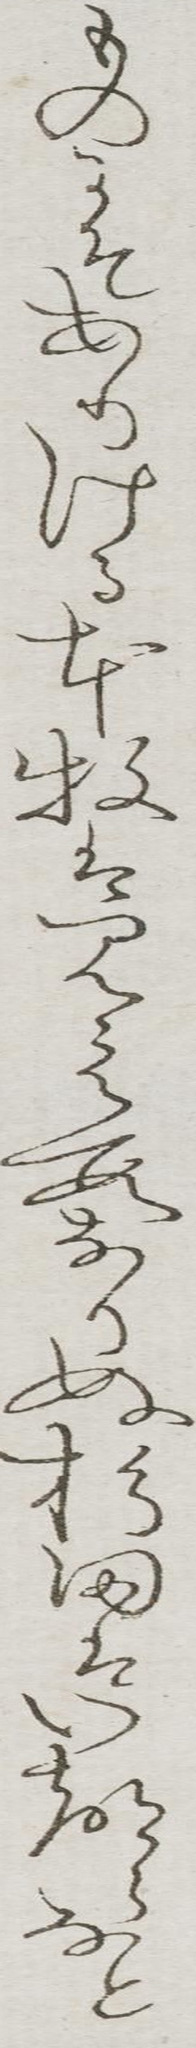ものにそありける本牧は見えすなりぬ杉田はいつらなと
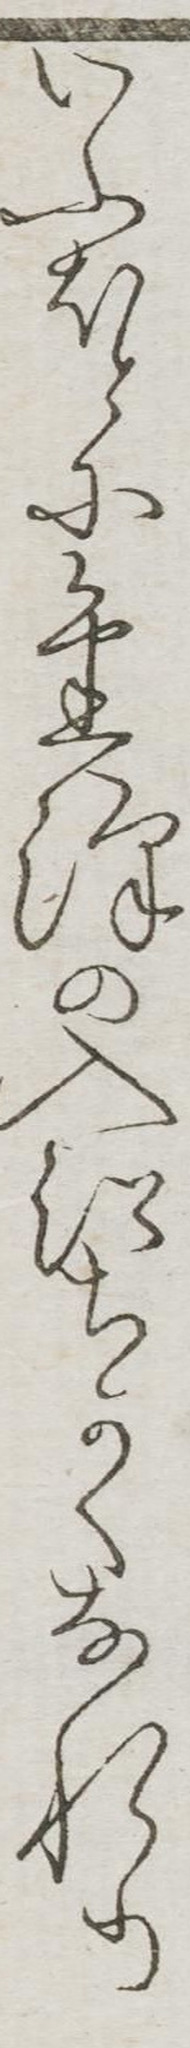いふほとに金沢の入江ちかくなれり

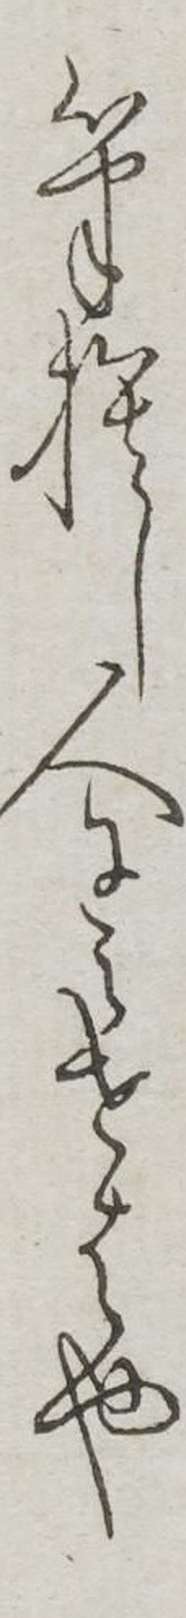筆捨し人にみせはや
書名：挿画熱海日記　全
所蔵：東京大学地震研究所図書室 Earthquake Research Institute Library, The University of Tokyo, JAPAN
